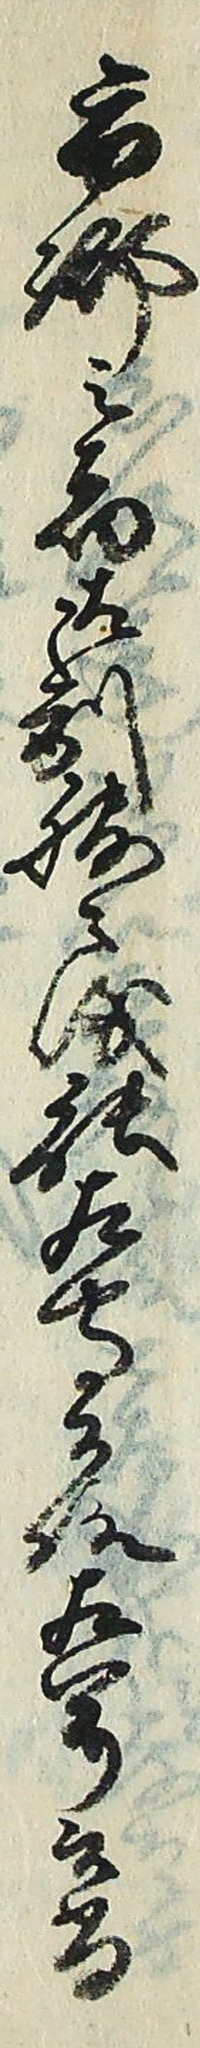市郷之者御制服之儀能相守候趣相聞候尚
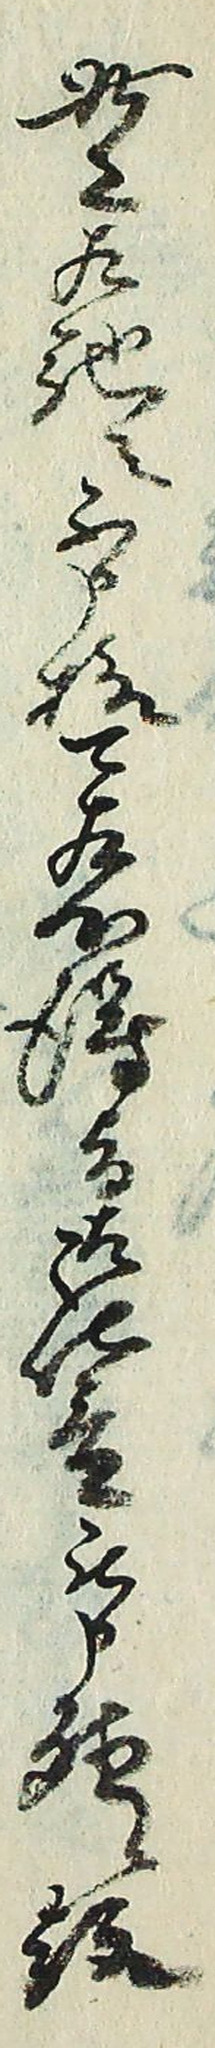此上相弛ミ不申様可相心得旨御仕置被申聴候趣
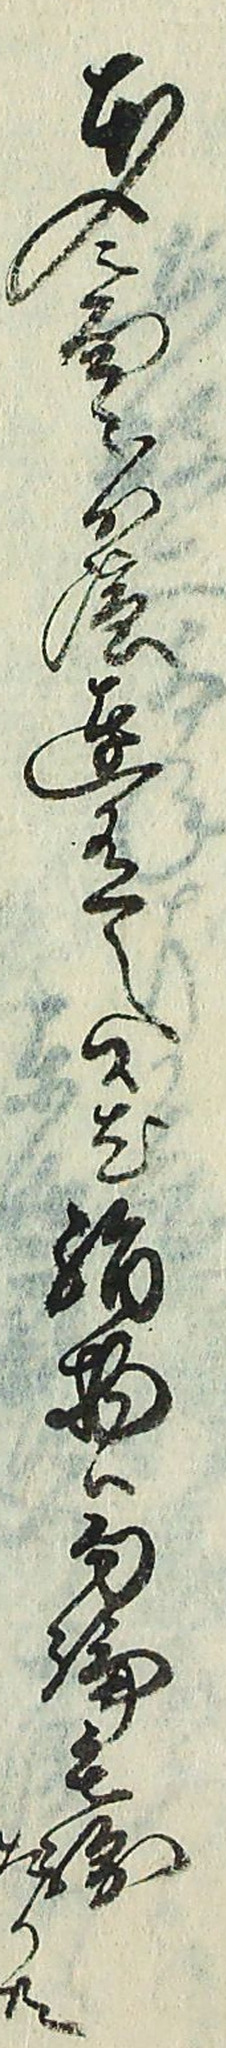本〆之面々ゟ演達有之候尤絹物ハ勿論毛綿たり共
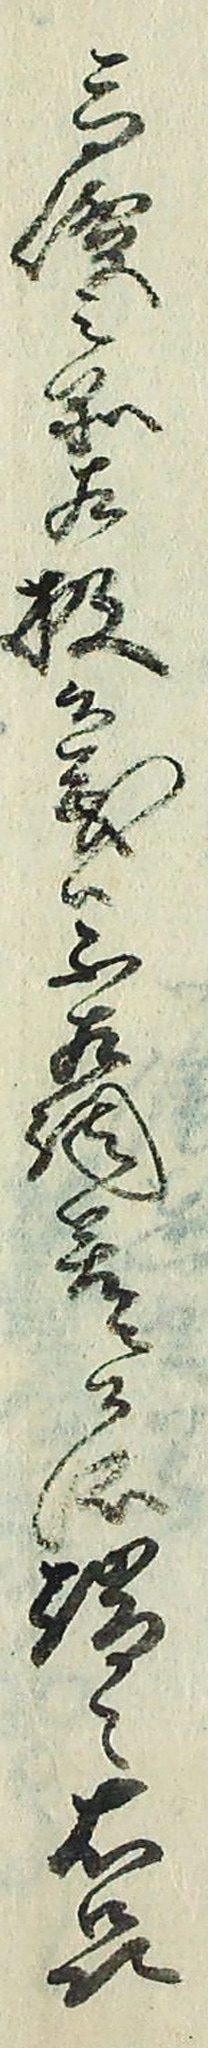高價之品相扱候義ハ不相調筈ニ候所端々右品
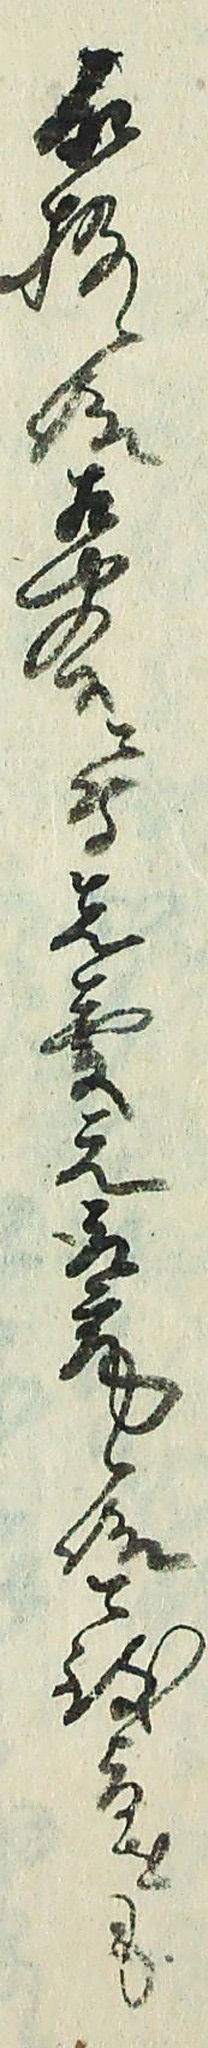取扱候様相聞候ニ付先賣元取究候様可致旨をも
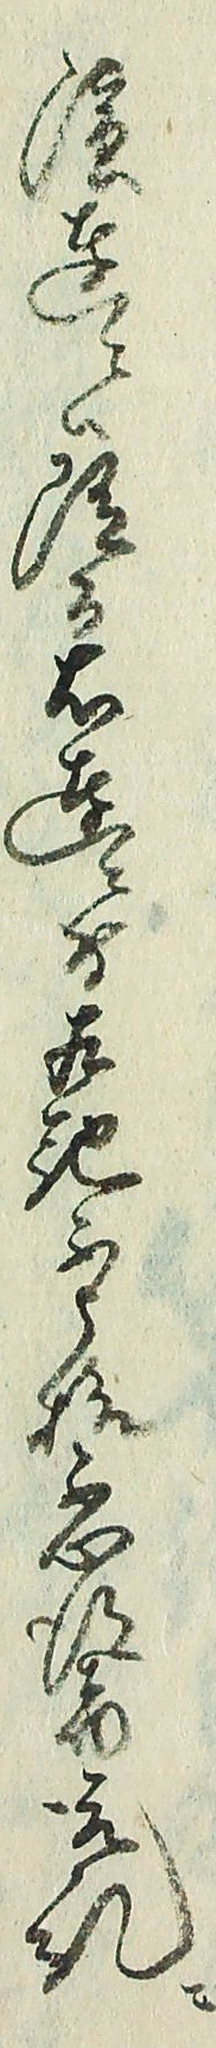演達ニ候随而右達ニ付相弛不申様不心得者取糺ニ
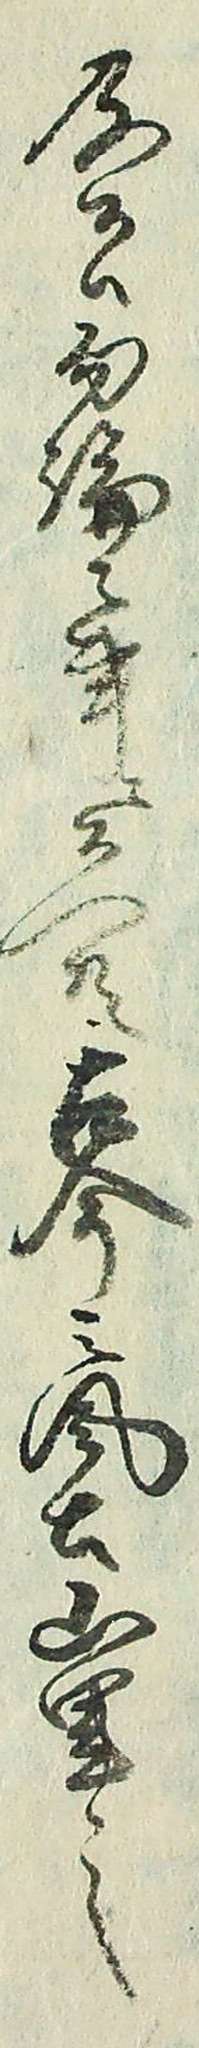及候ハ勿論之事ニ候へ共古今之風土山里之
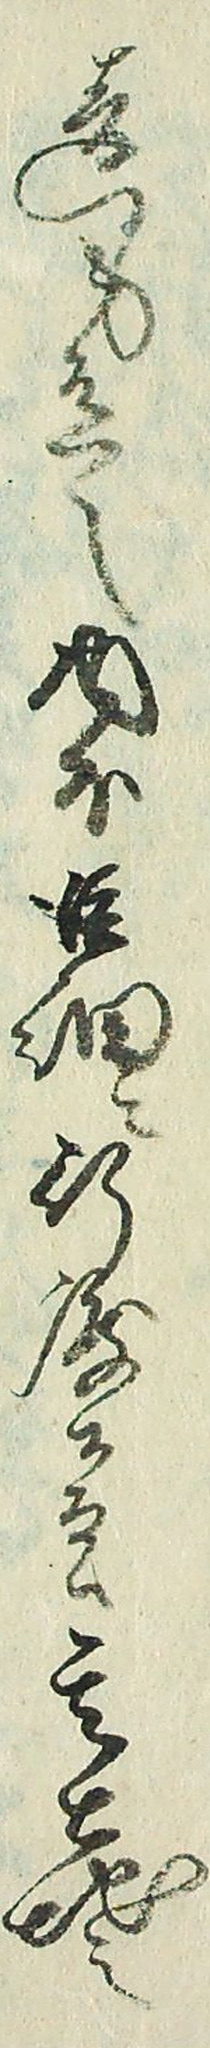違も有之内外巨細ニ行渡候而ハ其土地之
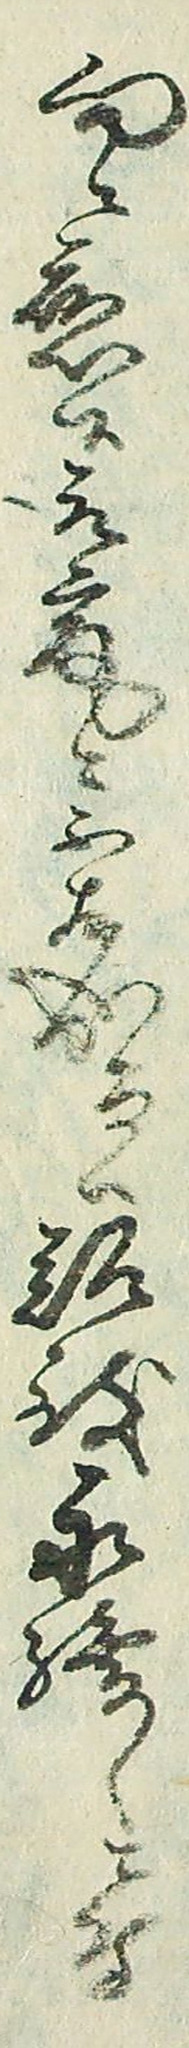向ニ應候取究ニ不相成候而ハ難致永續候ニ付
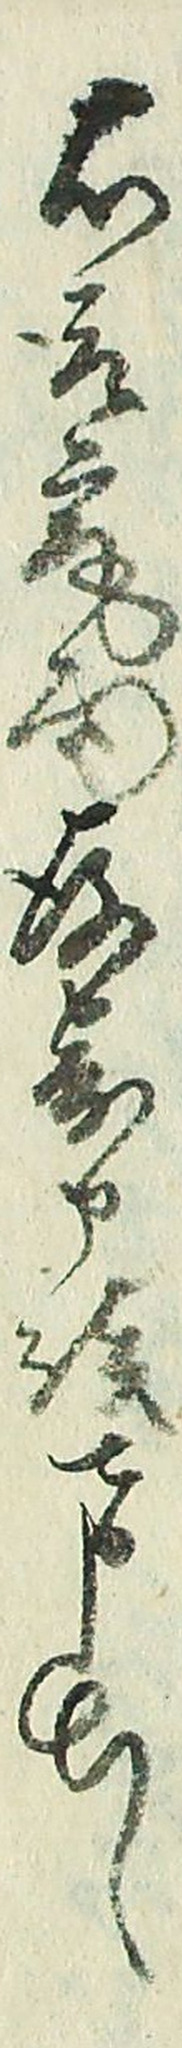右取究向存寄申談可申出候

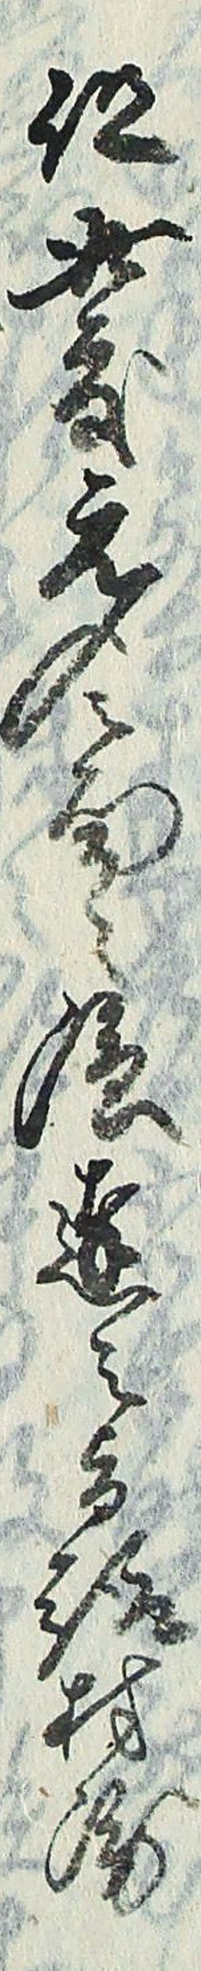但此度元〆之面々演達之旨趣村浦
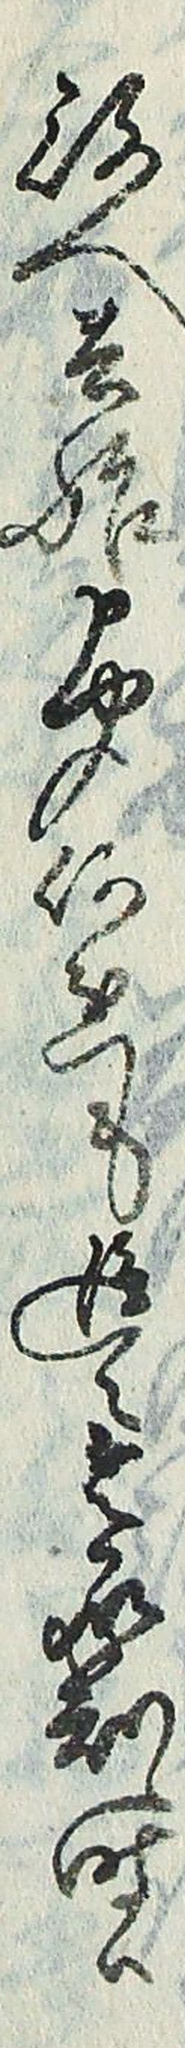役人共始申聞何れも追々令承知候時ハ
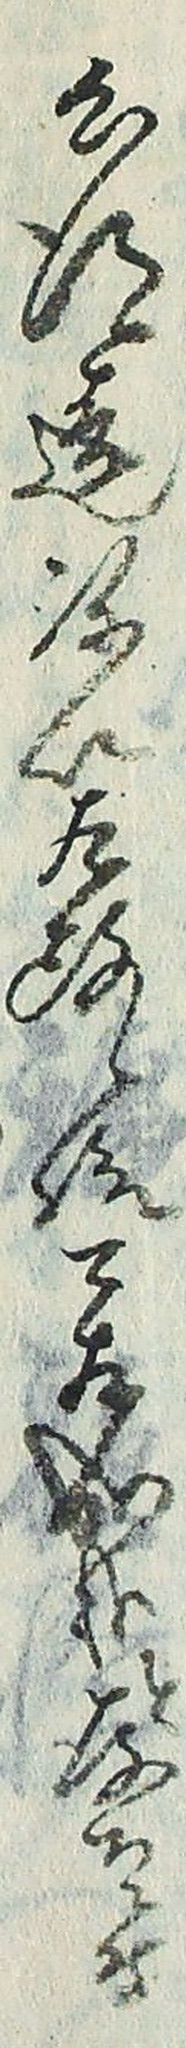心得違弥以相改候様可相成哉と存候ニ付
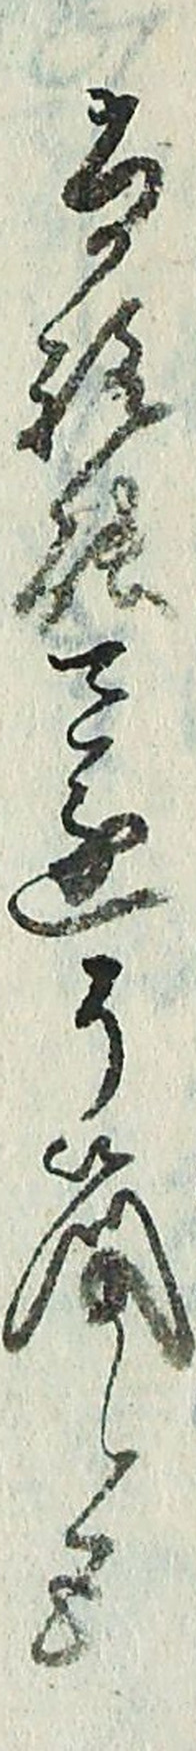尚程能可遂了簡候以上
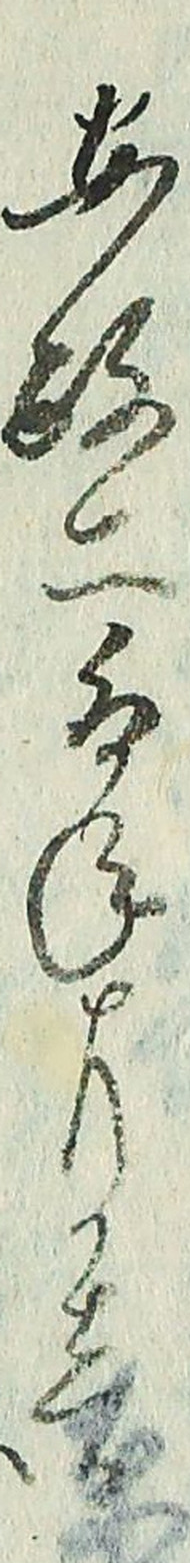安政二卯年十月十二日
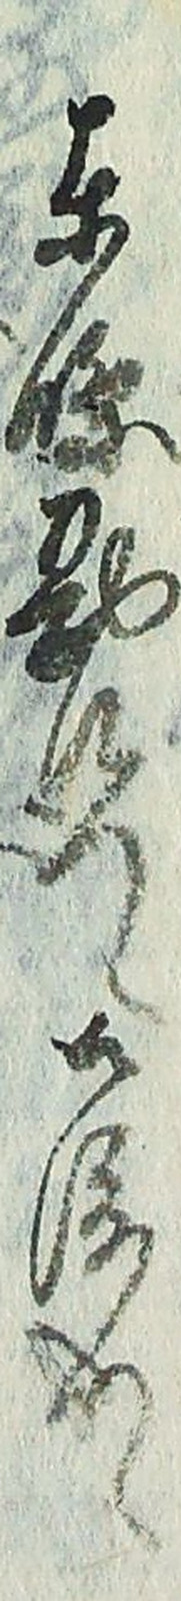東條勘左衛門へ御渡成候
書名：諸御趣意書并御下知向之写
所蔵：鳴門教育大学 Naruto University of Education
